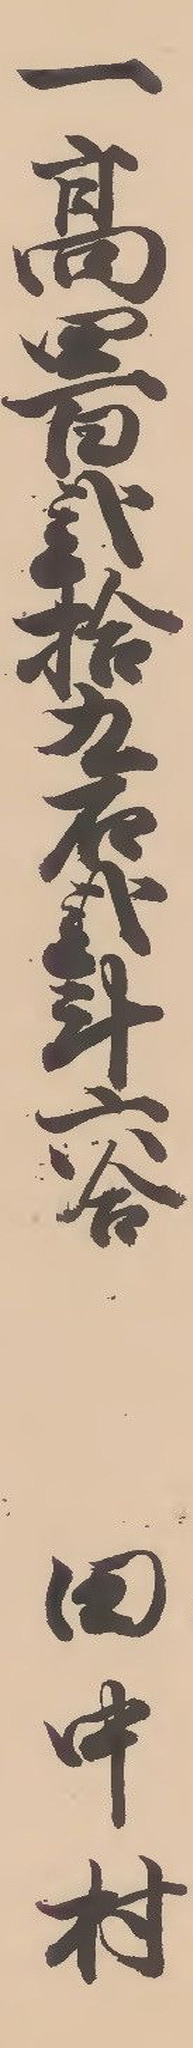一高四百弐拾九石弐斗六合田中村
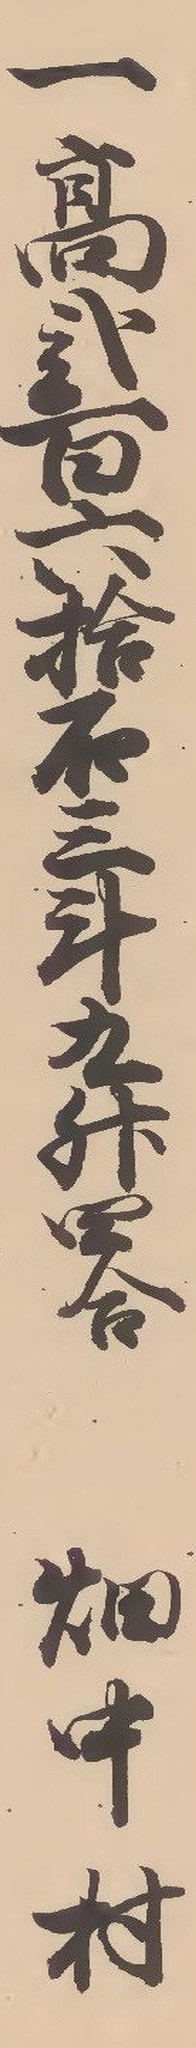一高弐百六拾石三斗九升四合畑中村
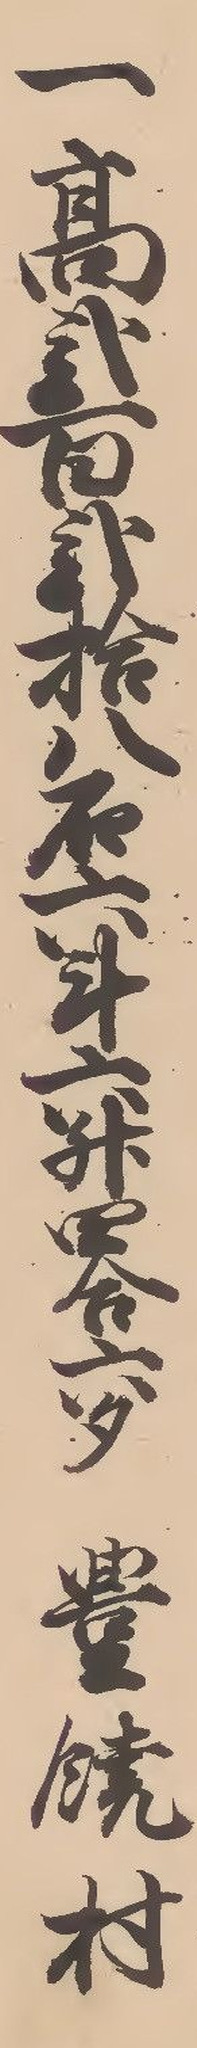一高弐百弐拾八石六斗六升四合六勺豊饒村

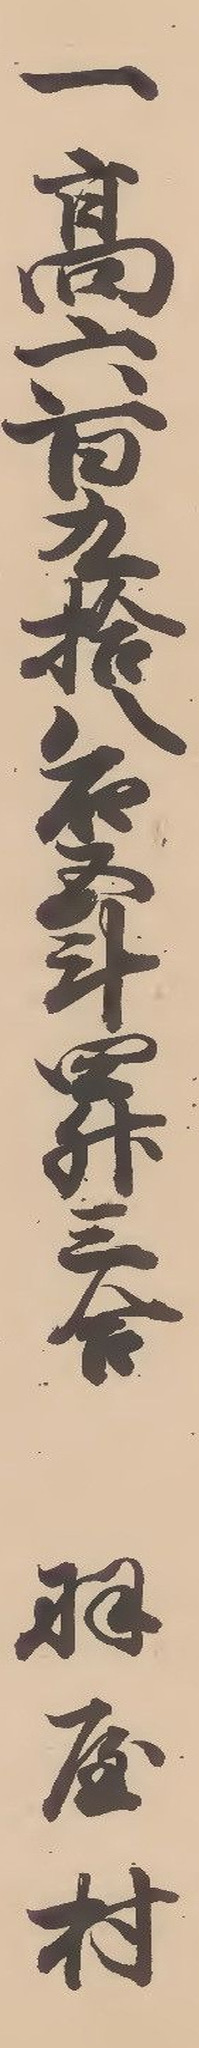一高六百九拾八石五斗四升三合羽屋村
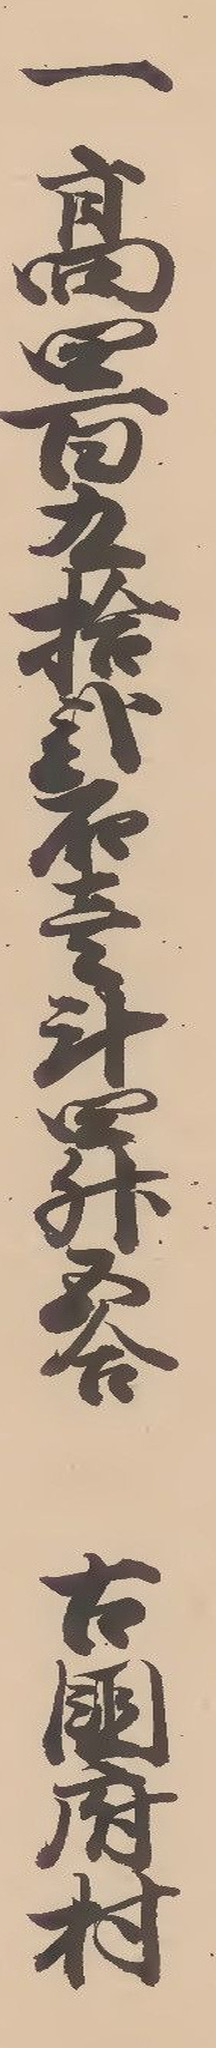一高四百九拾弐石壱斗四升五合古国府村
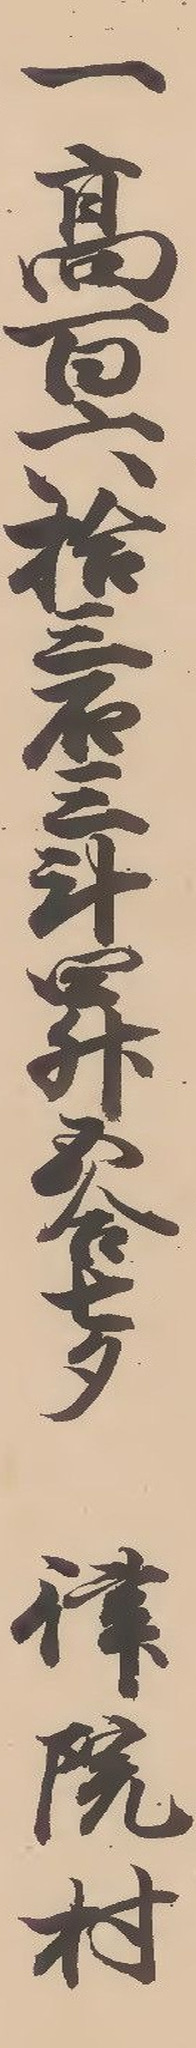一高百六拾三石三斗四升五合七勺律院村
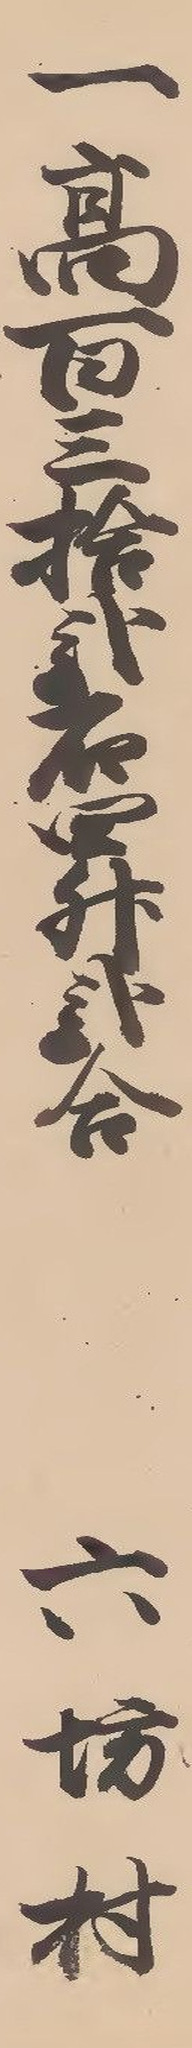一高百三拾弐石四升弐合六坊村
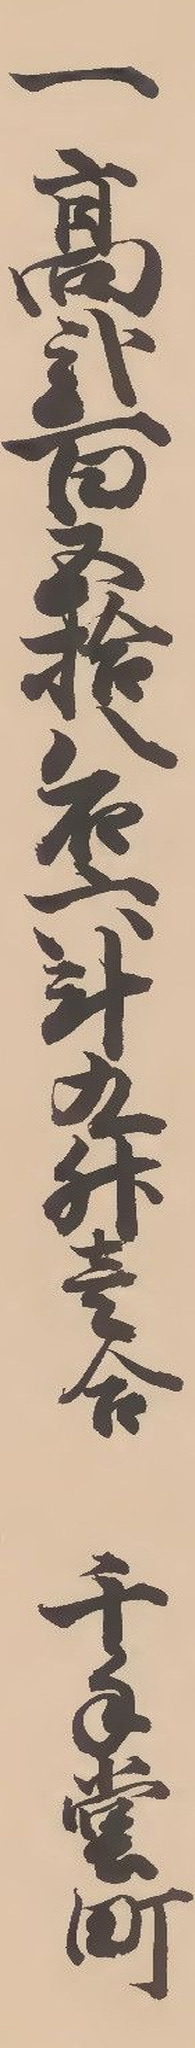一高弐百五拾八石六斗九升壱合千手堂町
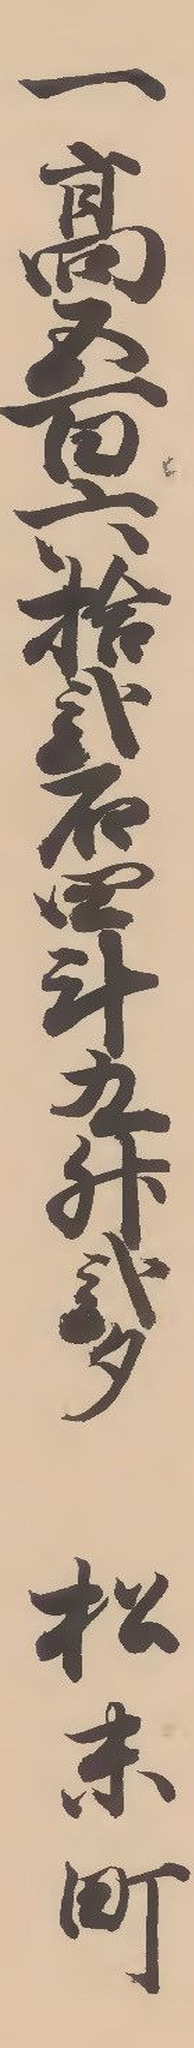一高五百六拾弐石四斗九升弐勺松末町
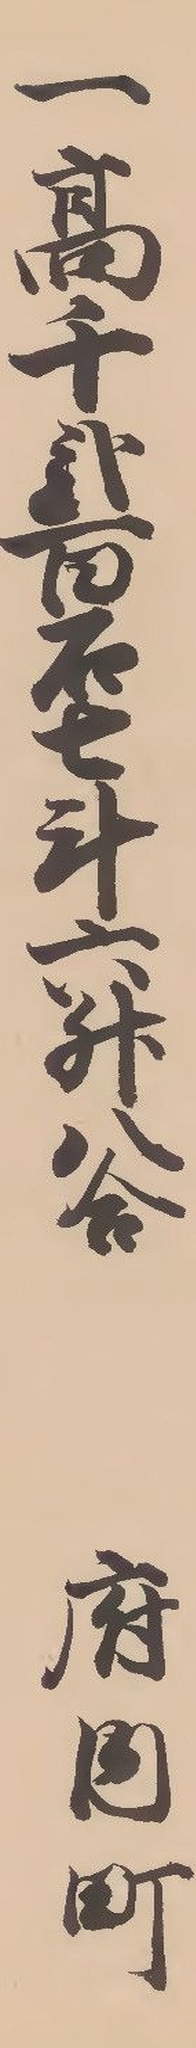一高千弐百石七斗六升八合府内町
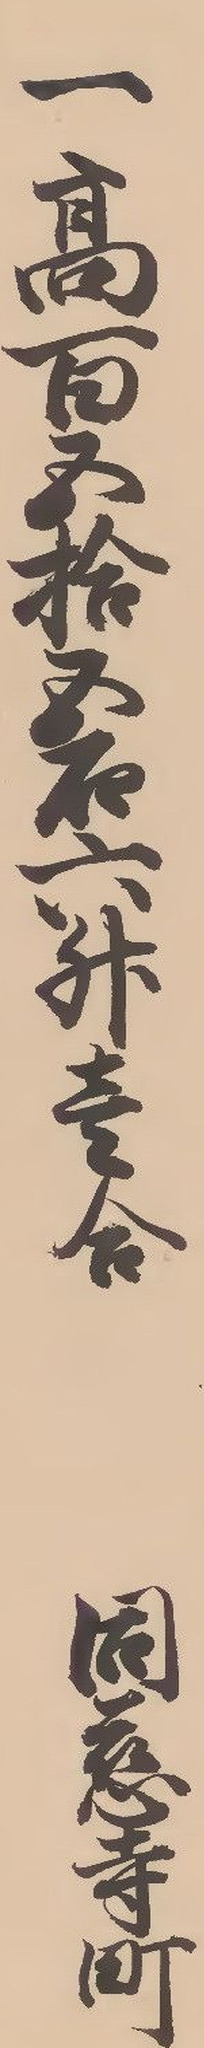一高百五拾五石六升壱合同慈寺町

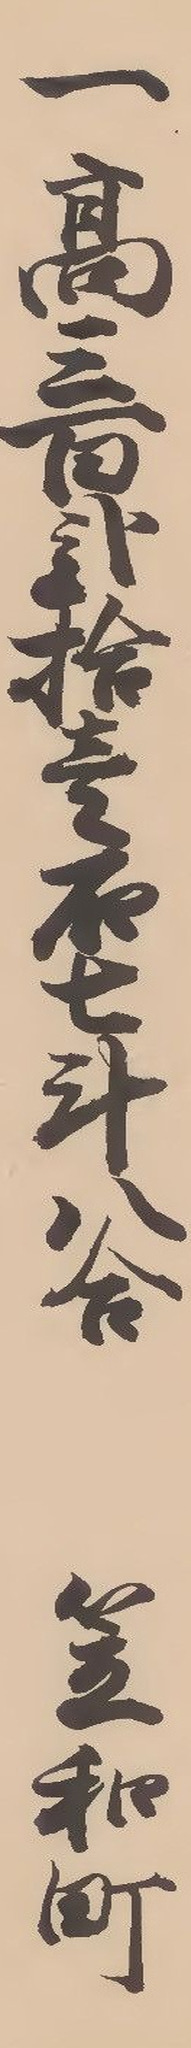一高三百弐拾壱石七斗八合笠和町
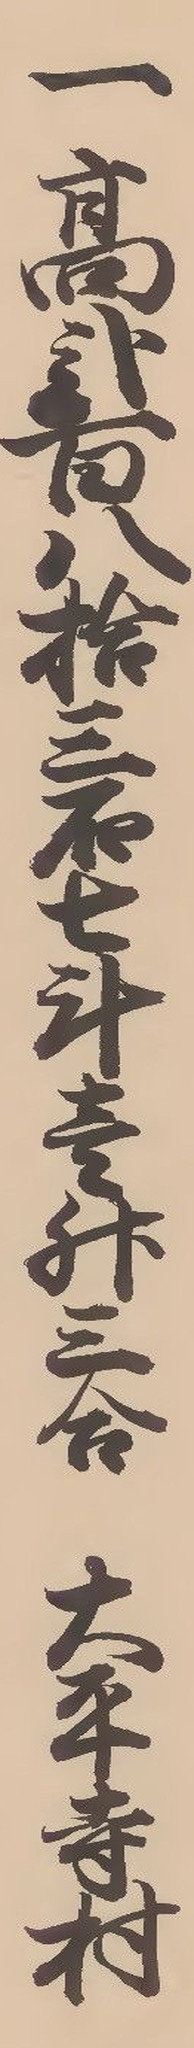一高弐百八拾三石七斗壱升三合大平寺村
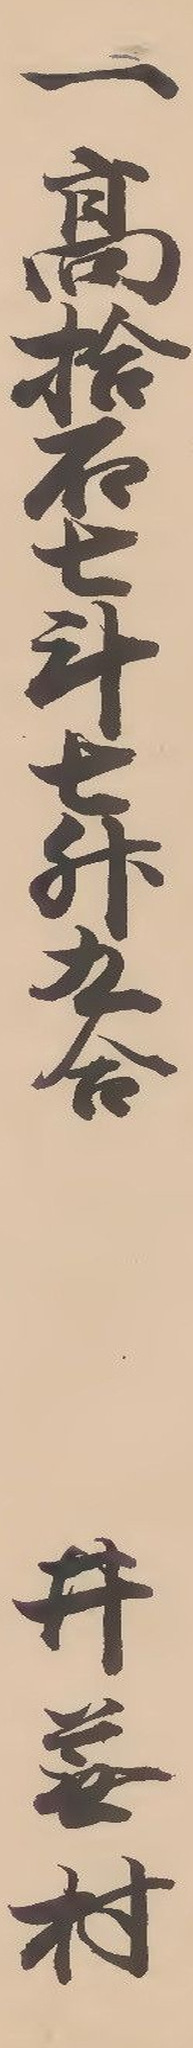一高拾石七斗七升九合井蕪村
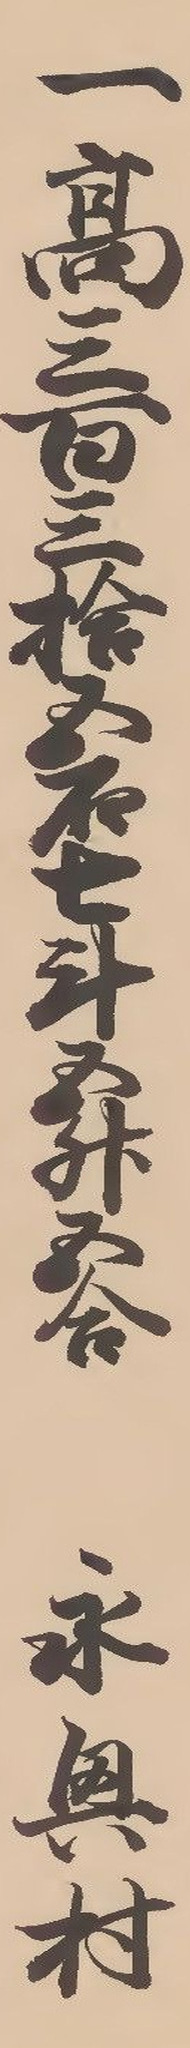一高三百三拾五石七斗五升五合永興村
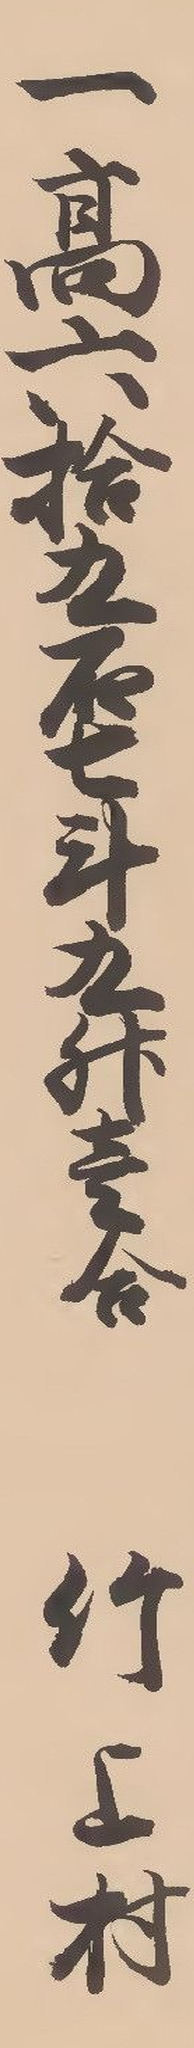一高六拾九石七斗九升壱合竹上村
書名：豊後国郷帳
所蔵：国立公文書館 National Archives of Japan
